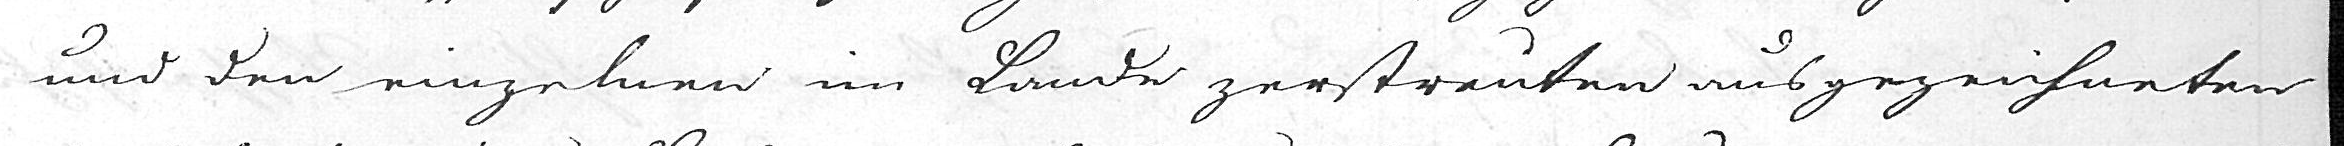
und den einzelnen im Lande zerstreuten ausgezeichneten
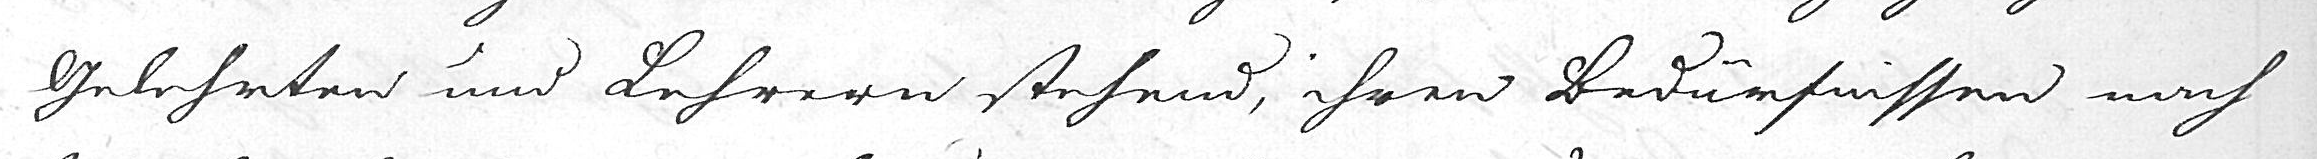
Gelehrten und Lehrer stehend, ihren Bedürfnissen nach
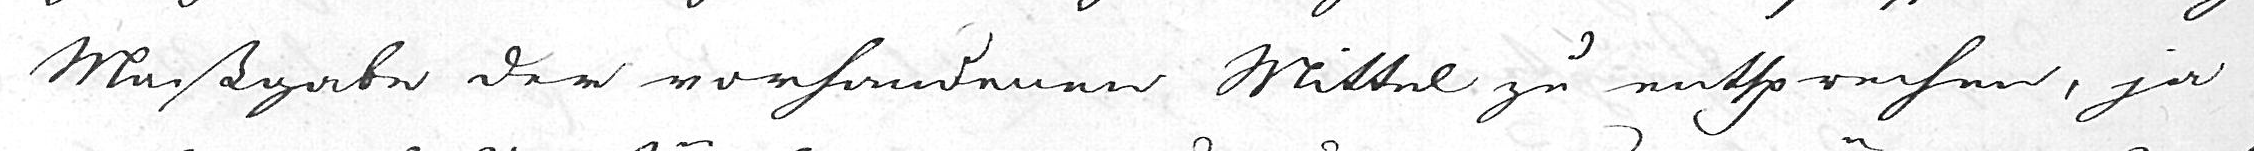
Maßgabe der vorhandenen Mittel zu entsprechen, ja
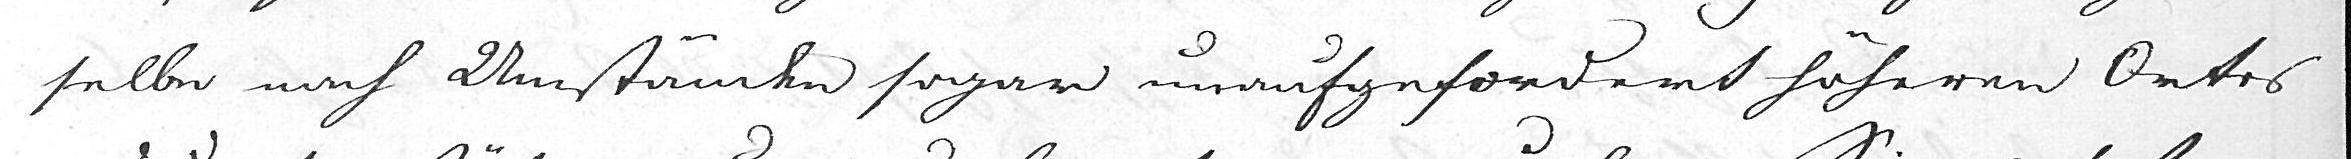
selbe nach Umständen sogar unaufgefordert höheren Ortes
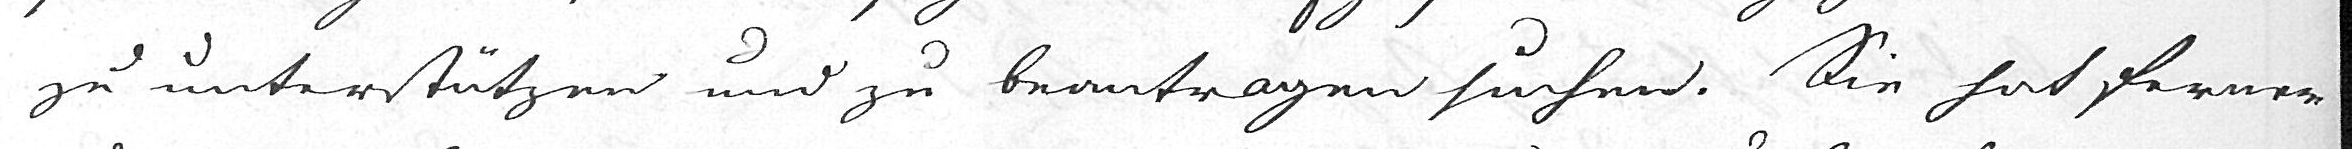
zu unterstützen und zu beantragen suchen. Sie hat ferner
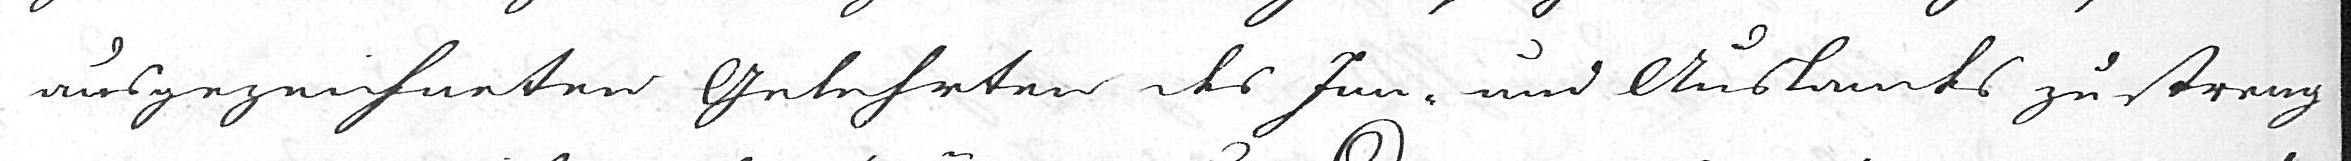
ausgezeichneten Gelehrten des Inn- und Anslandes zu streng
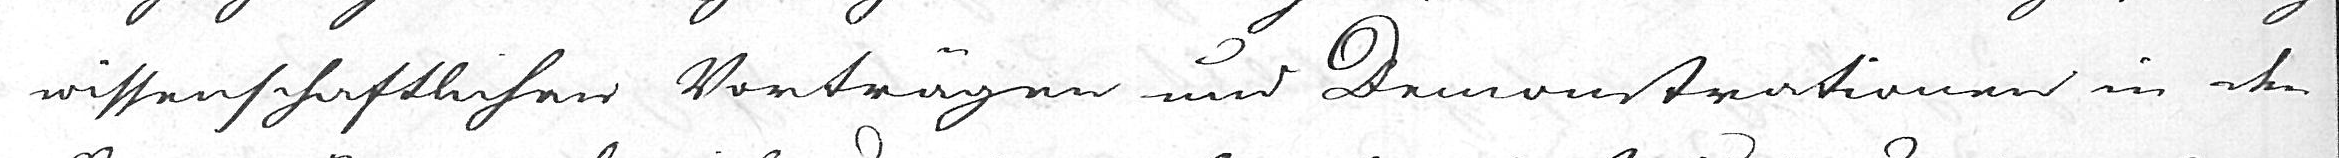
wissenschaftlichen Vorträge und Demonstrationen in den
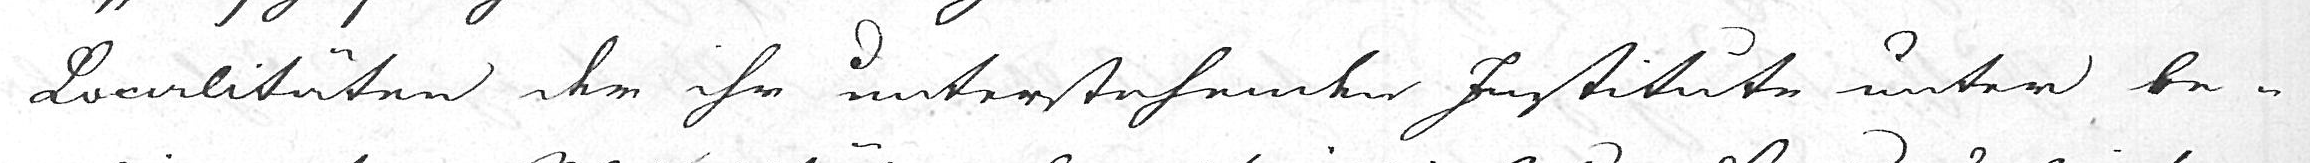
Localitäten der ihr unterstehenden Institute unter be-
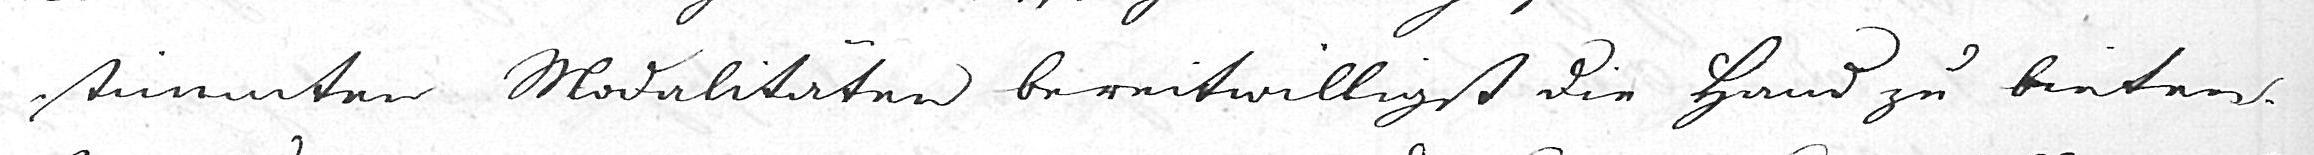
stimmten Modalitäten bereitwilligst die Hand zu bieten.
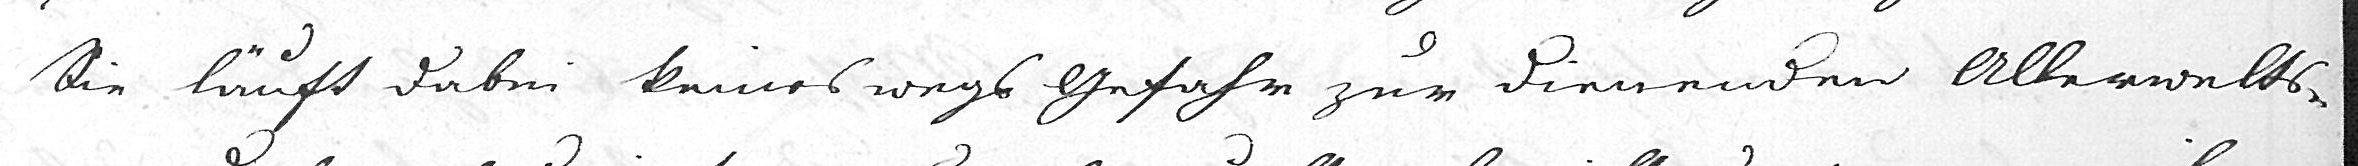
Sie läuft dabei keinesweg Gefahr zur dienenden Allerwelts-
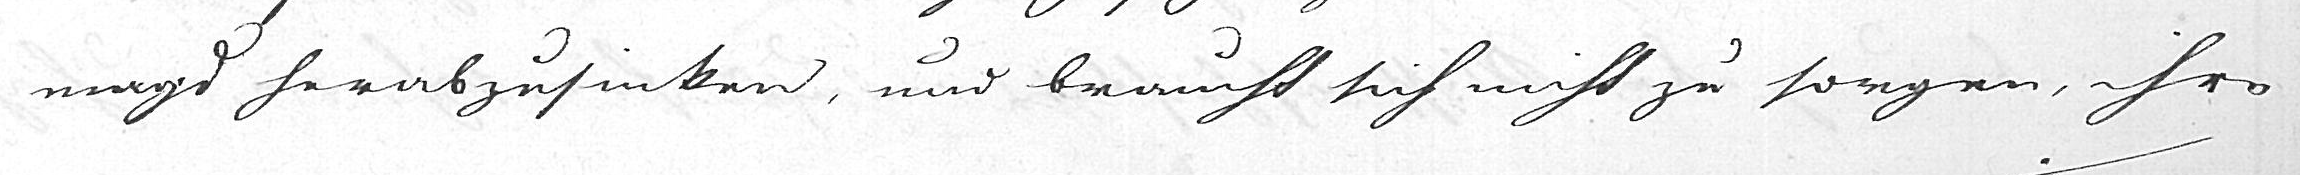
magd herabzusinken, und braucht sich nicht zu sorgen, ihre
